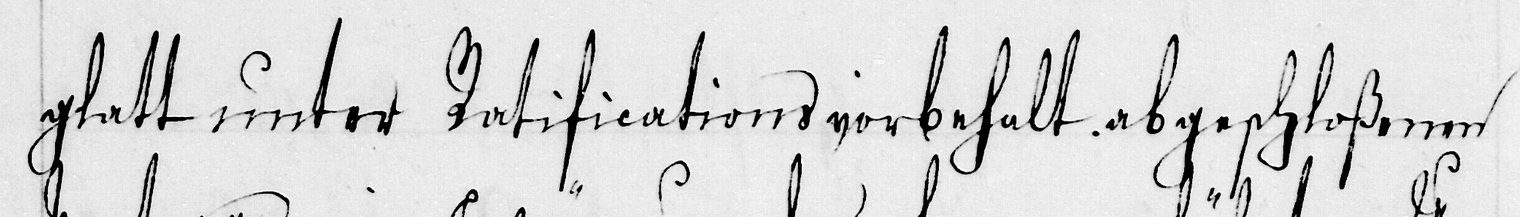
glatt unter Ratificationsvorbehalt abgeschloßenen
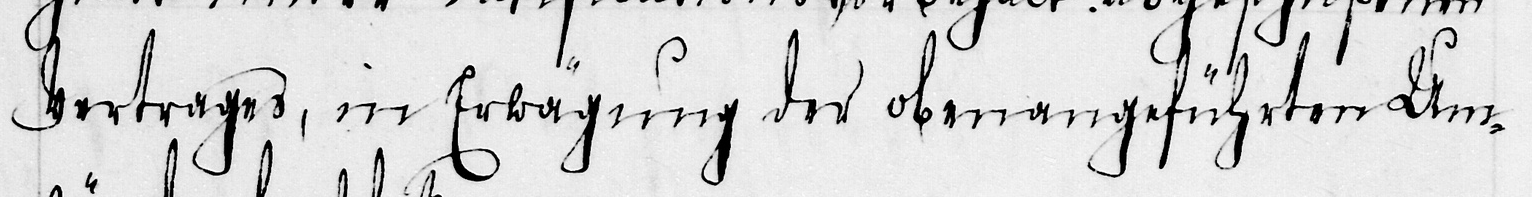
Vertrages, in Erwägung der obenangeführten Um¬
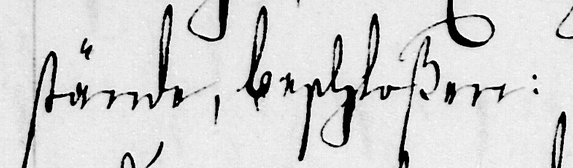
stände, beschloßen:
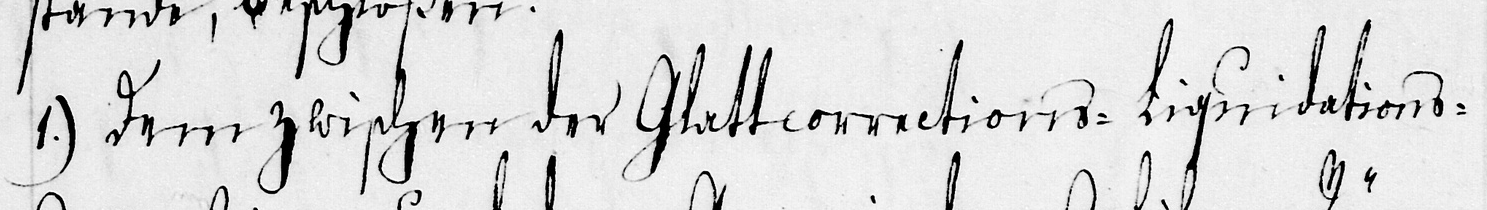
1.) Dem zwischen der Glattcorrections-Liquidation¬
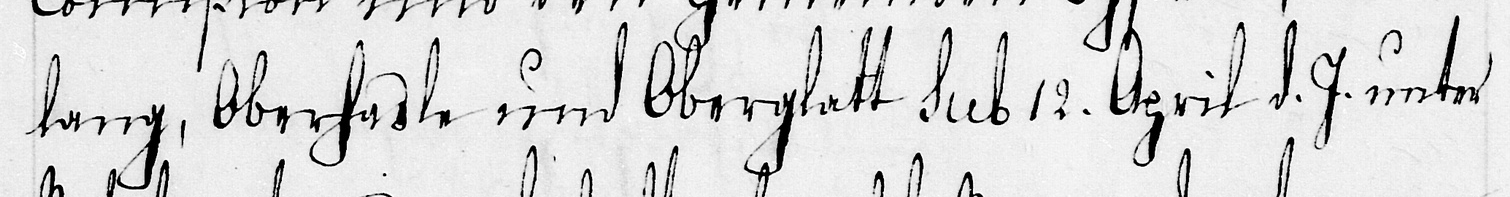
lang, Oberhasle und Oberglatt sub 12. April d. J. unter
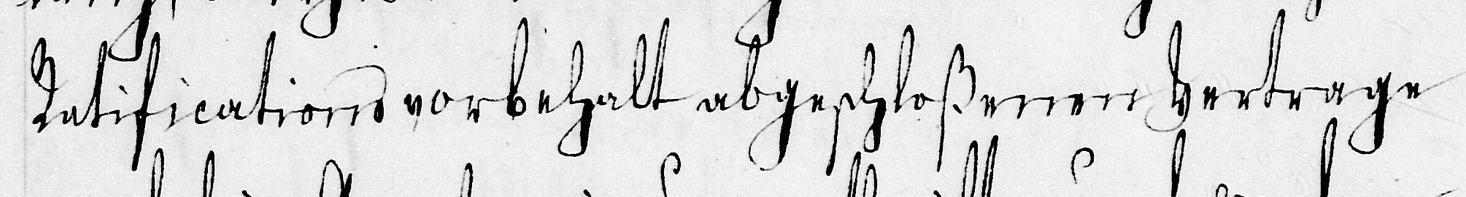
Ratificationsvorbehalt abgeschloßenen Vertrage
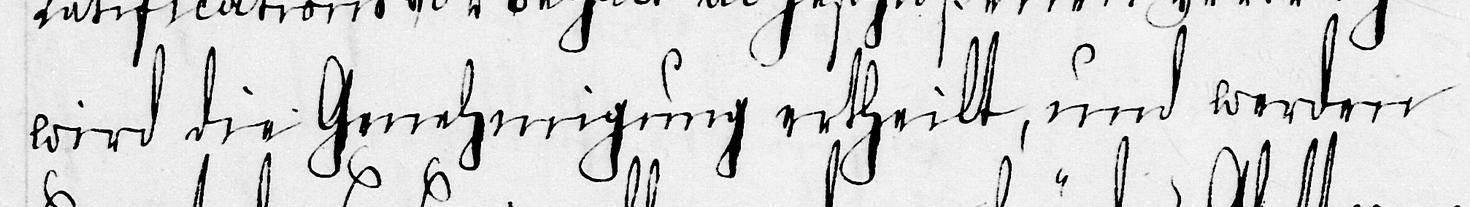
wird die Genehmigung ertheilt, und werden
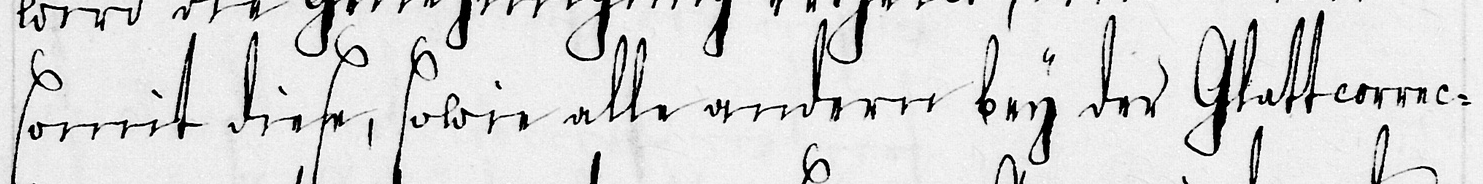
somit diese, sowie alle andern bey der Glattcorre¬
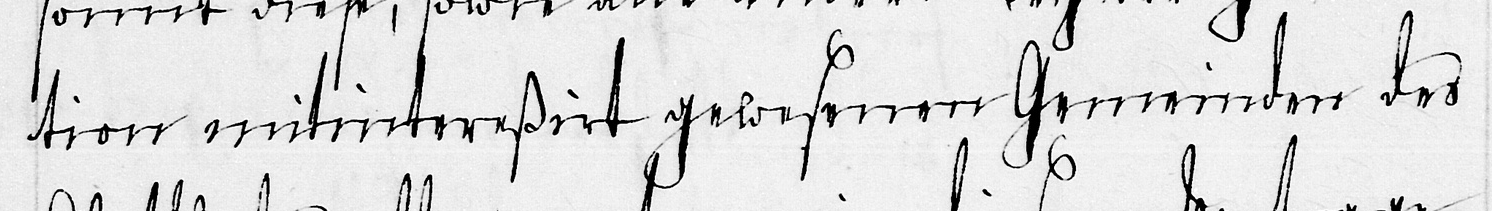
ction mitintereßirt gewesenen Gemeinden des
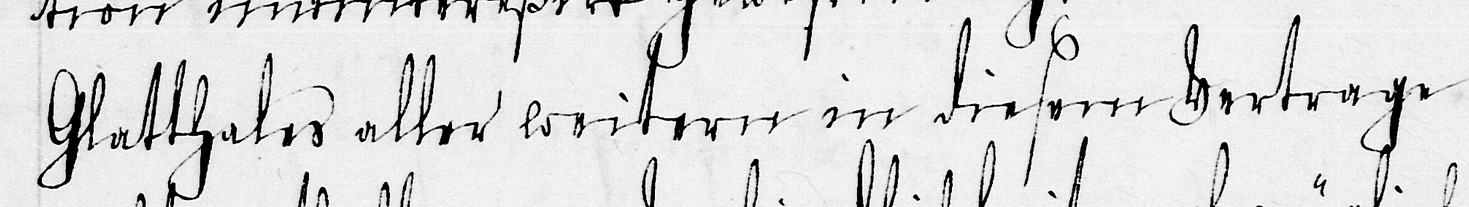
Glatthales aller weitern in diesem Vertrage
